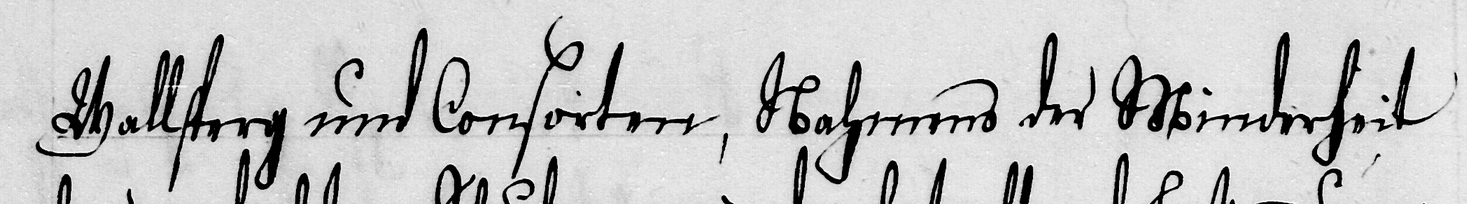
Wallsperg und Consorten, Nahmens der Minderheit
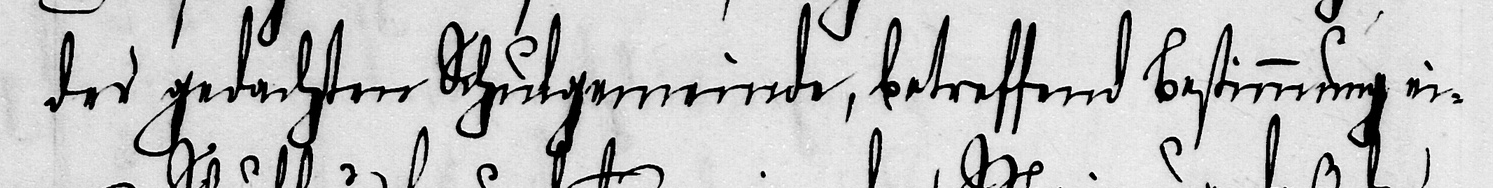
der gedachten Schulgemeinde, betreffend Bestimmung ei¬
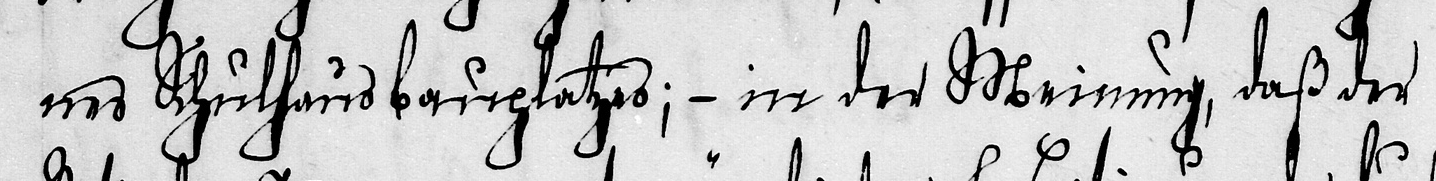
nes Schulhausbauplatzes; – in der Meinung, daß der
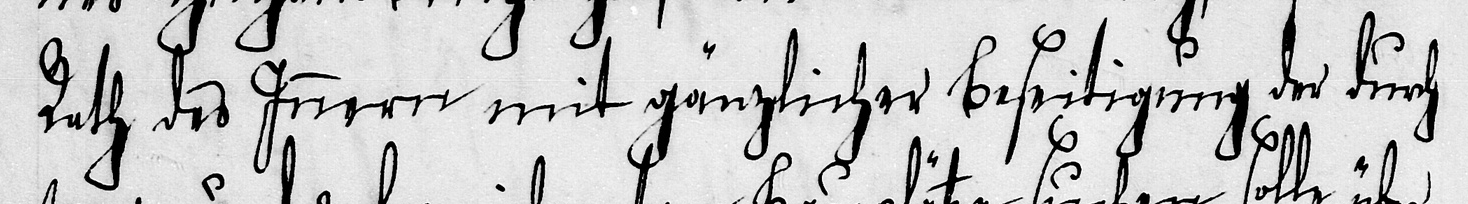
Rath des Innern mit gänzlicher Beseitigung der durch
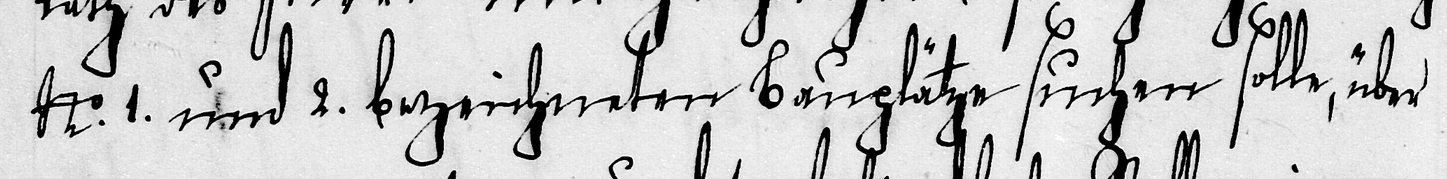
No. 1. und 2. bezeichneten Bauplätze suchen solle, über
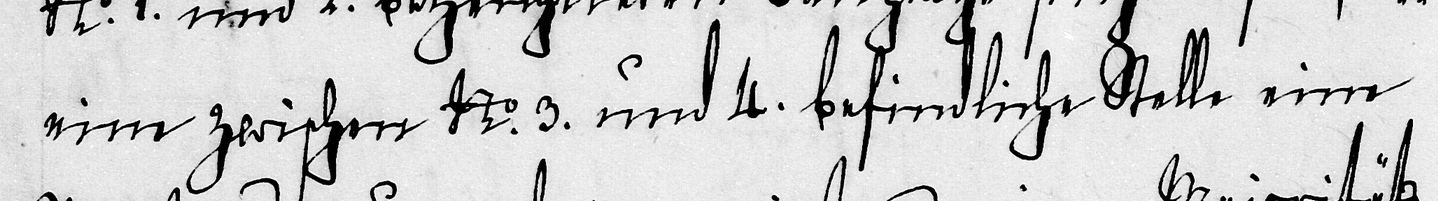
eine zwischen No. 3. und 4. befindliche Stelle eine
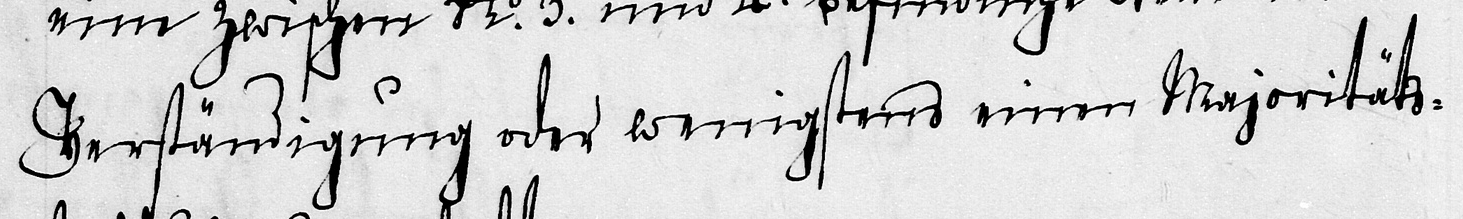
Verständigung oder wenigstens einen Majoritäts¬
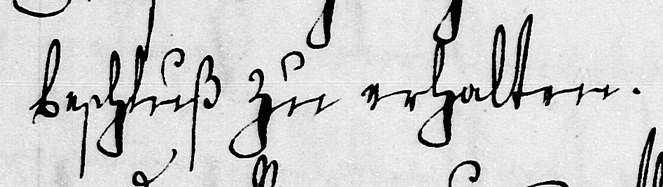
beschluß zu erhalten.
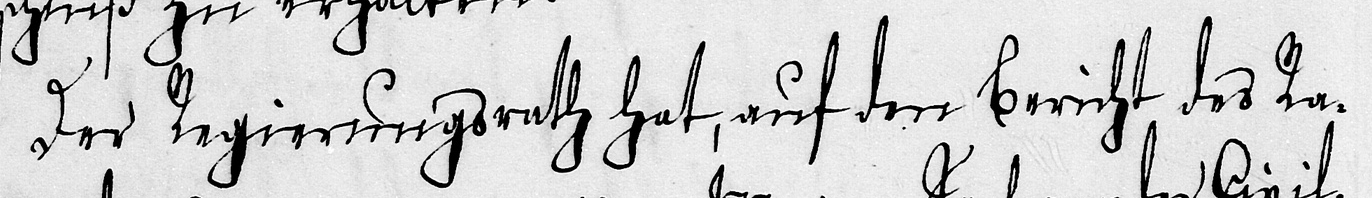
Der Regierungsrath hat, auf den Bericht des Ra¬
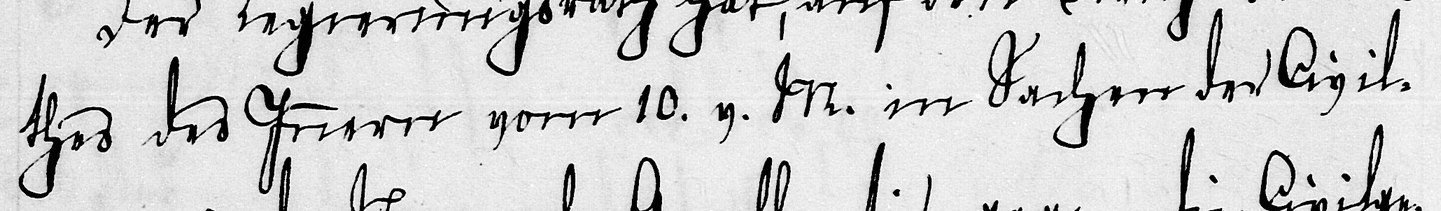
thes des Innern vom 10. v. M. in Sachen der Civil¬
